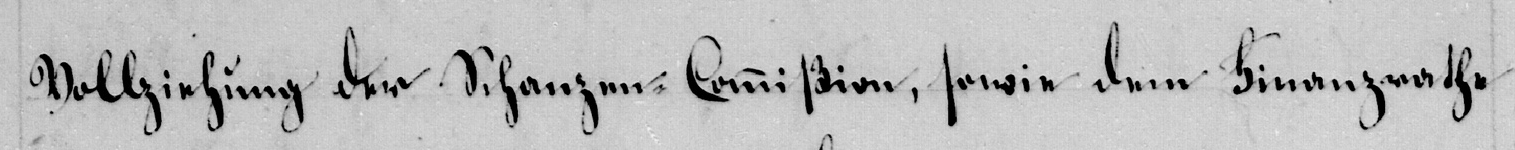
Vollziehung der Schanzen-Commißion, sowie dem Finanzrathe
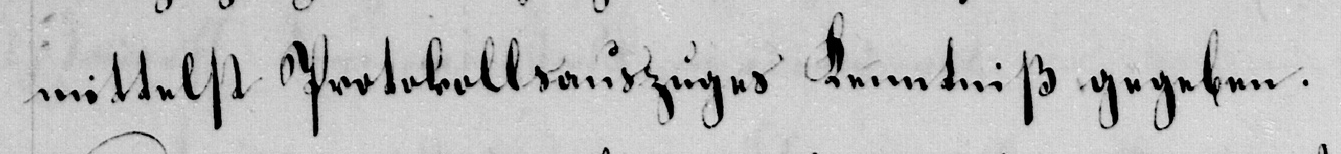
mittelst Protokollsauszuges Kenntniß gegeben.
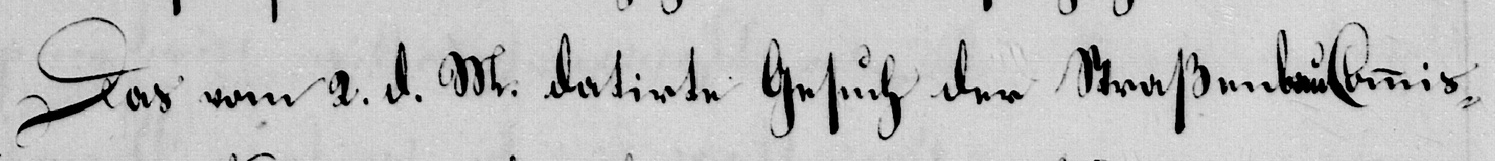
Das vom 2. d. M. datirte Gesuch der Straßenbau-Commiß¬
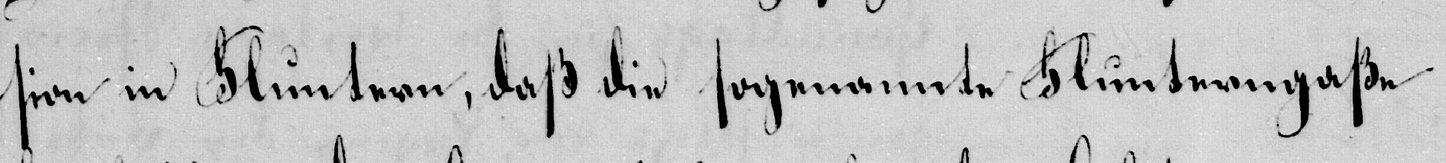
ion in Fluntern, daß die sogenannte Flunterngaße
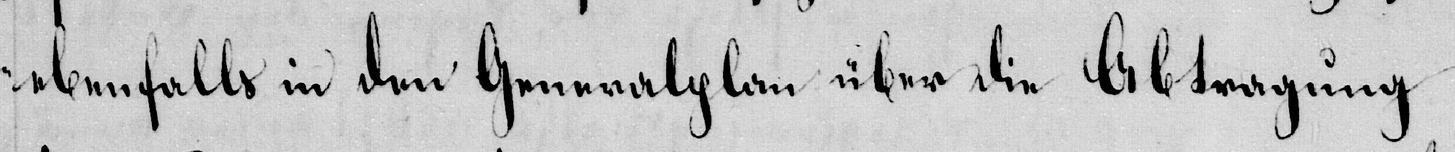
ebenfalls in den Generalplan über die Abtragung
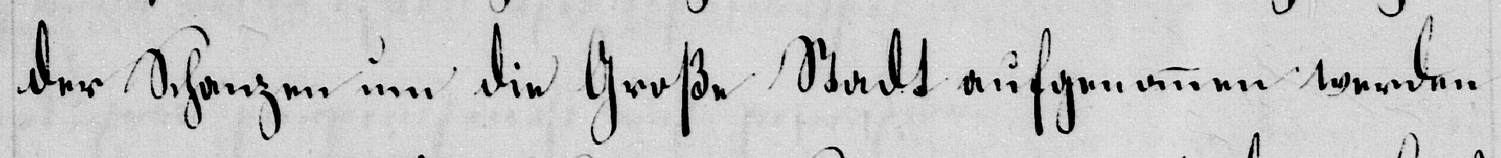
der Schanzen in die Große Stadt aufgenommen werden
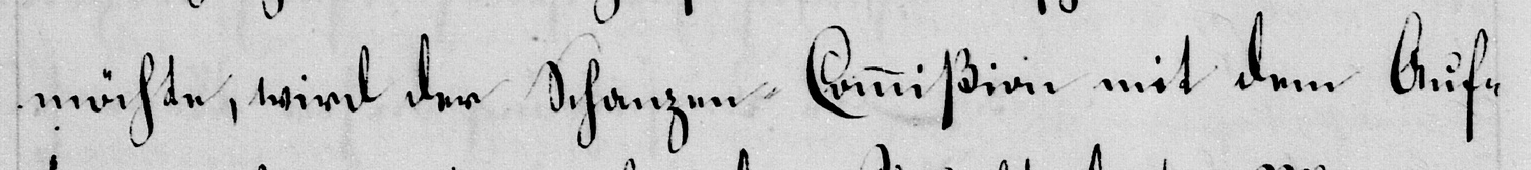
möchte, wird der Schanzen-Commißion mit dem Auf¬
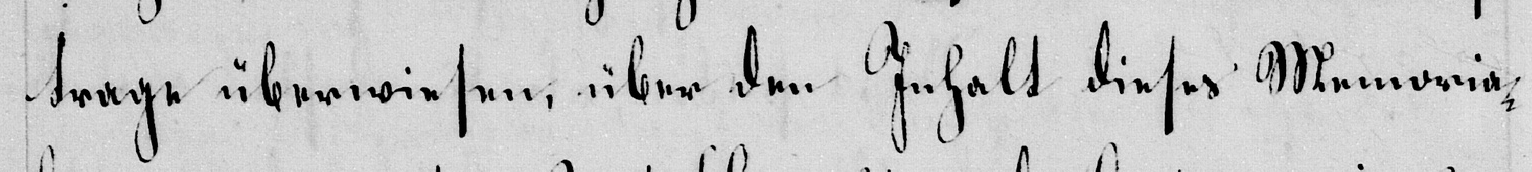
trage überwiesen, über den Inhalt dieses Memoria¬
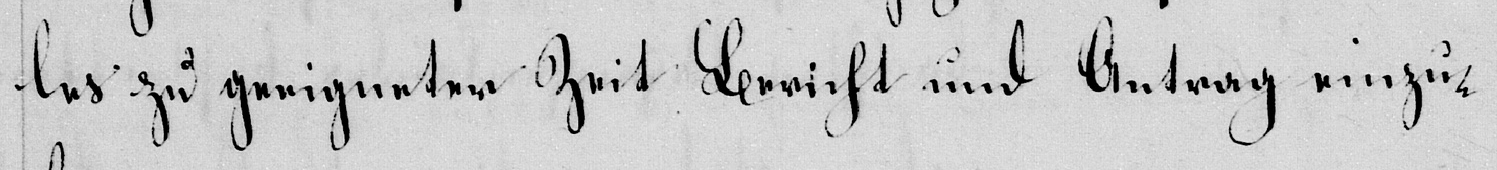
les zu geeigneter Zeit Bericht und Antrag einzu¬
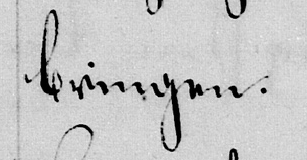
bringen.
